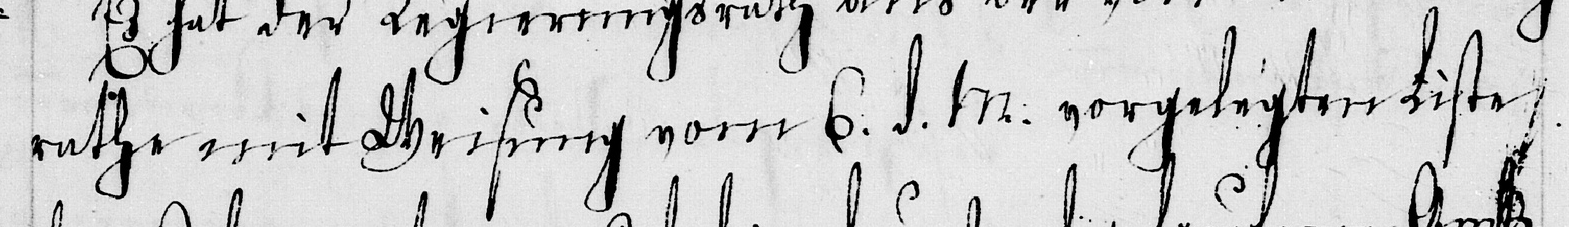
rathe mit Weisung vom 6. d. M. vorgelegten Liste
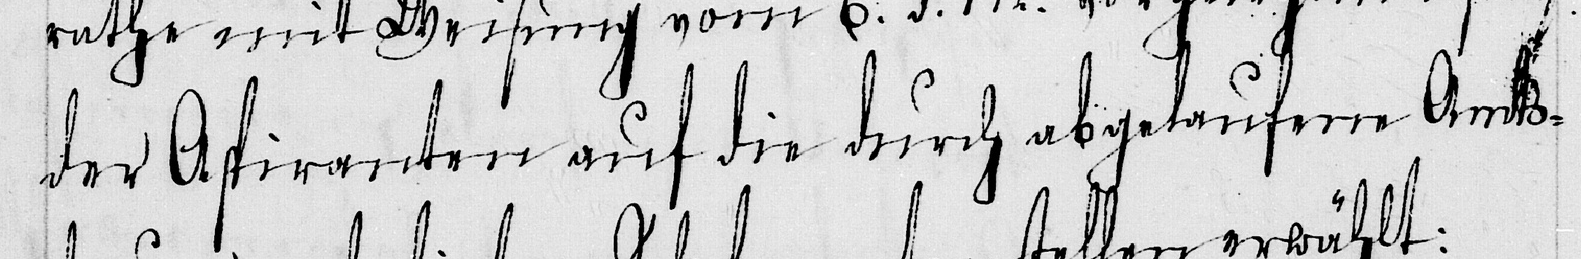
der Aspiranten auf die durch abgelaufene Amts¬
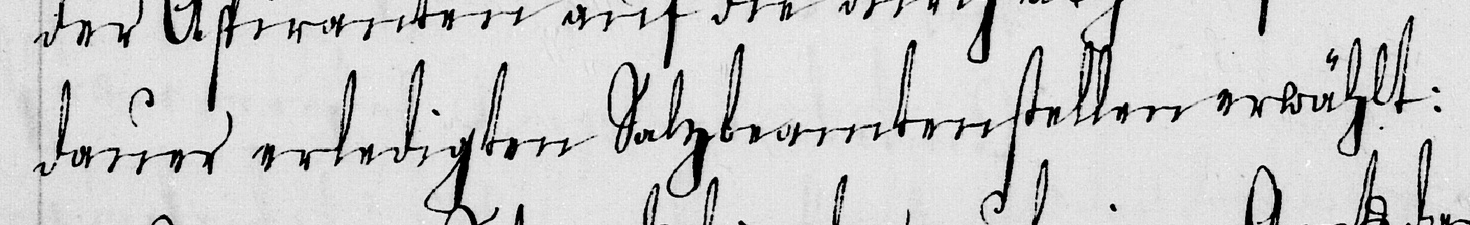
dauer erledigten Salzbeamtenstellen erwählt:
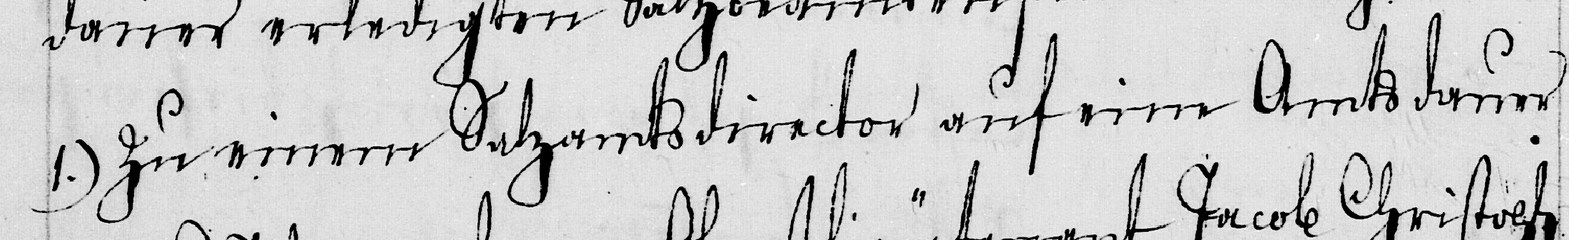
1.) Zu einem Salzamtsdirector auf eine Amtsdauer
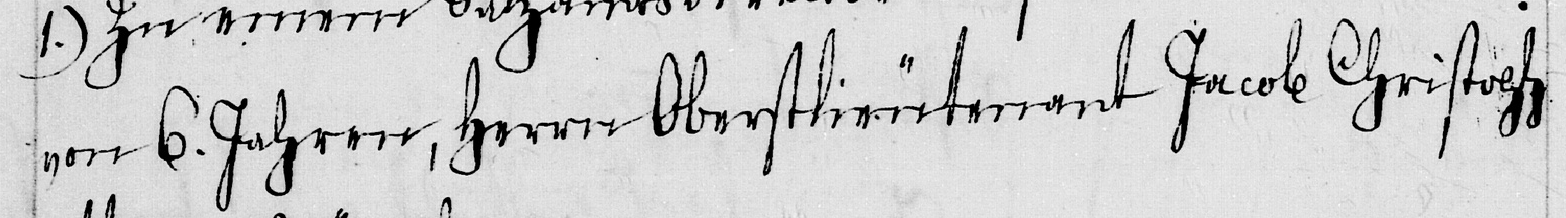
von 6. Jahren, Herrn Oberstlieutnant Jacob Christoph
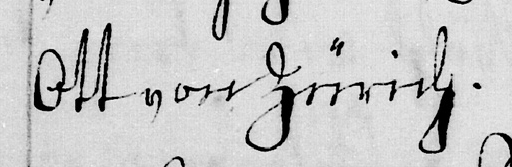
Ott von Zürich.
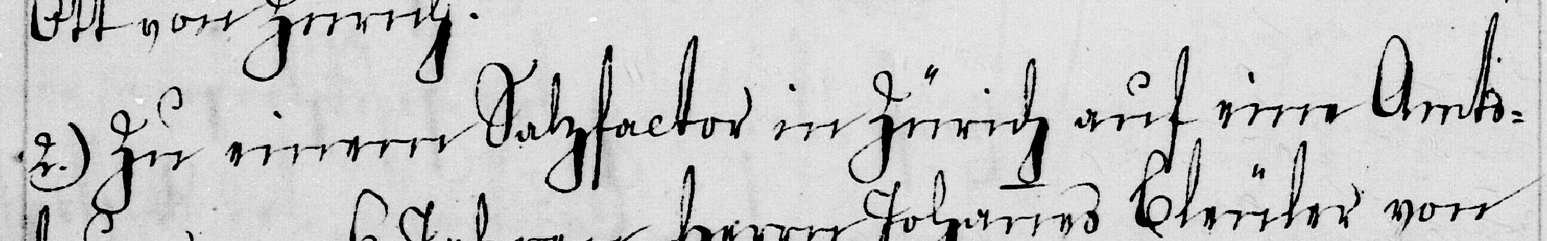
2.) Zu einem Salzfactor in Zürich auf eine Amts¬
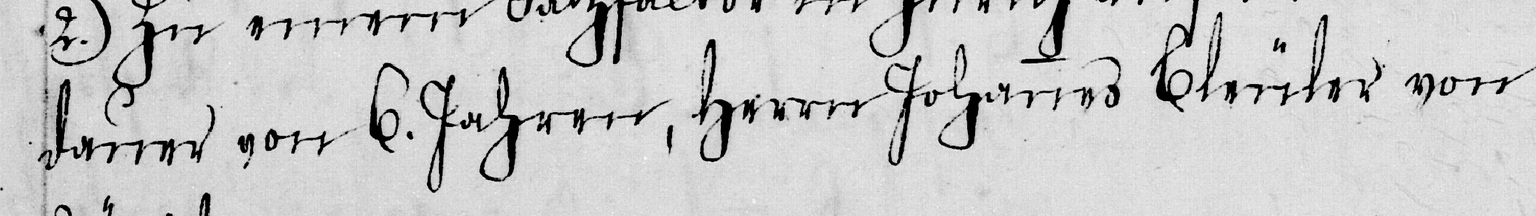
dauer von 6. Jahren, Herrn Johannes Bleuler von
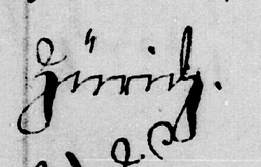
Zürich.
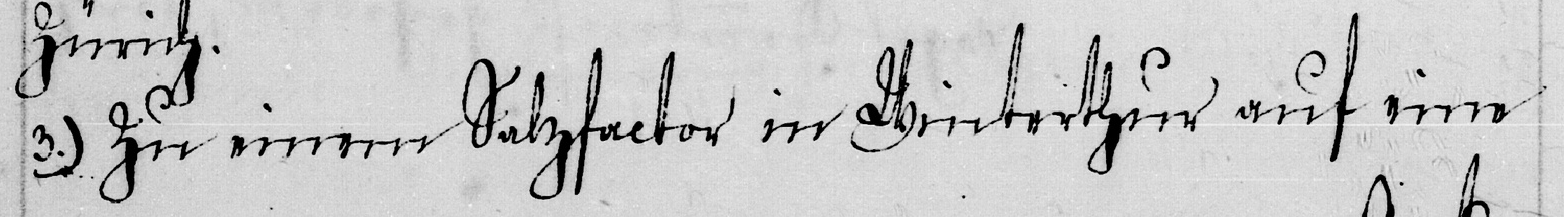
3.) Zu einem Salzfactor in Winterthur auf eine
